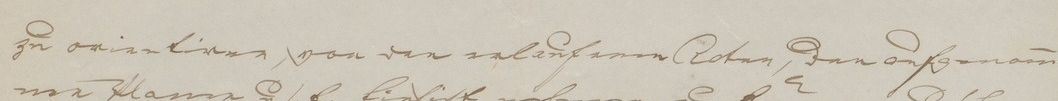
zu orientiren, von den erlaufenen Acten, den aufgenomm -
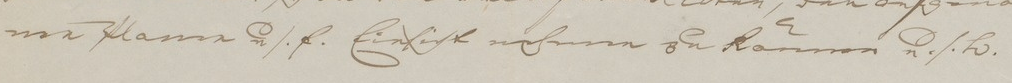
nen Planen u. s. f. Einsicht nehmen zu können u. s. w.
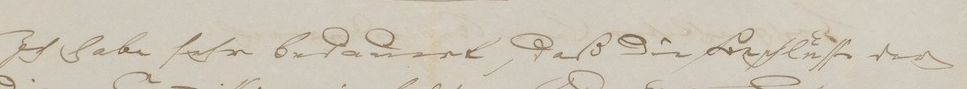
Ich habe sehr bedauert, daß die Beschlüsse der
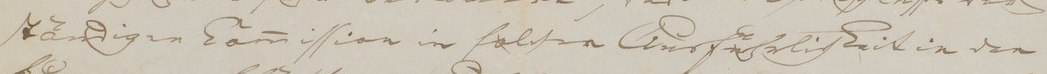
ständigen Commission in solcher Ausführlichkeit in den
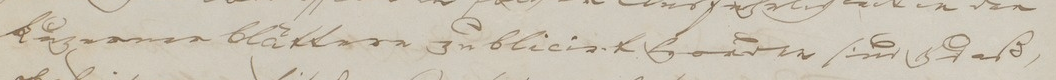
Luzerner blättern publicirt worden sind & das
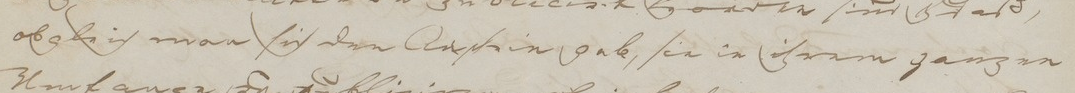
obleich man sich den Anschein gab, sie in ihrem ganzen
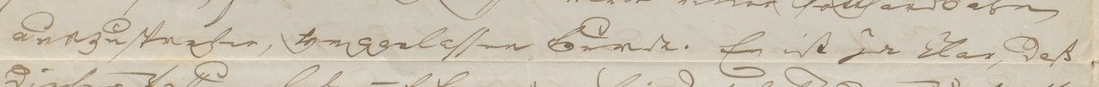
auszusprechen, weggelassen wurde. Es ist ja klar, daß
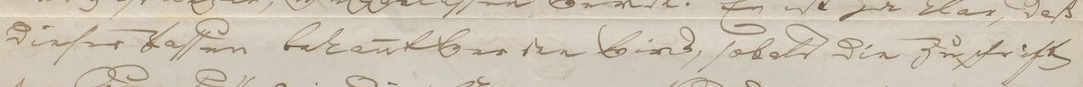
dieser Passus bekanntwerden wird, sobald die Zuschrift
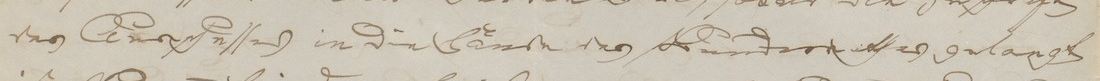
des Ausschusses in die Hände des Bundesrathes gelangt
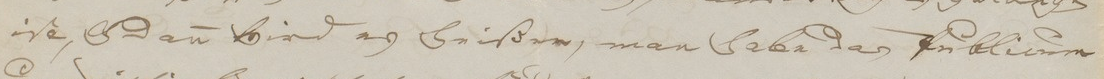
ist, & dann wird es heißen, man habe das Publicum
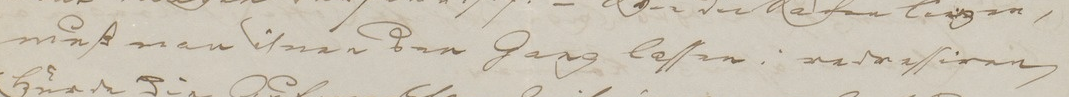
muß man ihnen den Gang lassen: redressiren
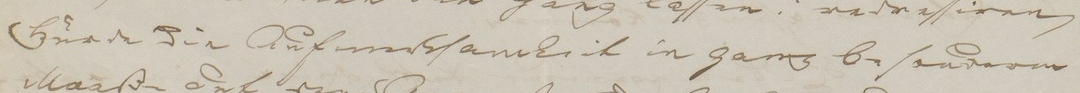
würde die Aufmerksamkeit in ganz besonderem
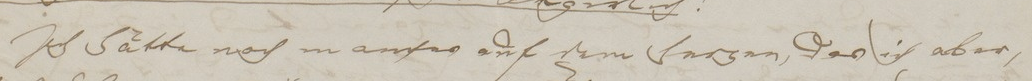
Ich hätte noch manches auf dem Herzen, das ich aber
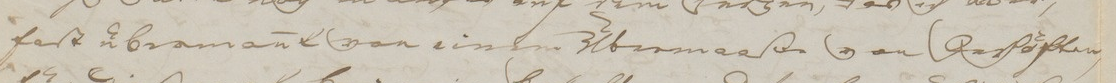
fast übermannt von einem Übermaaße von Geschäften
